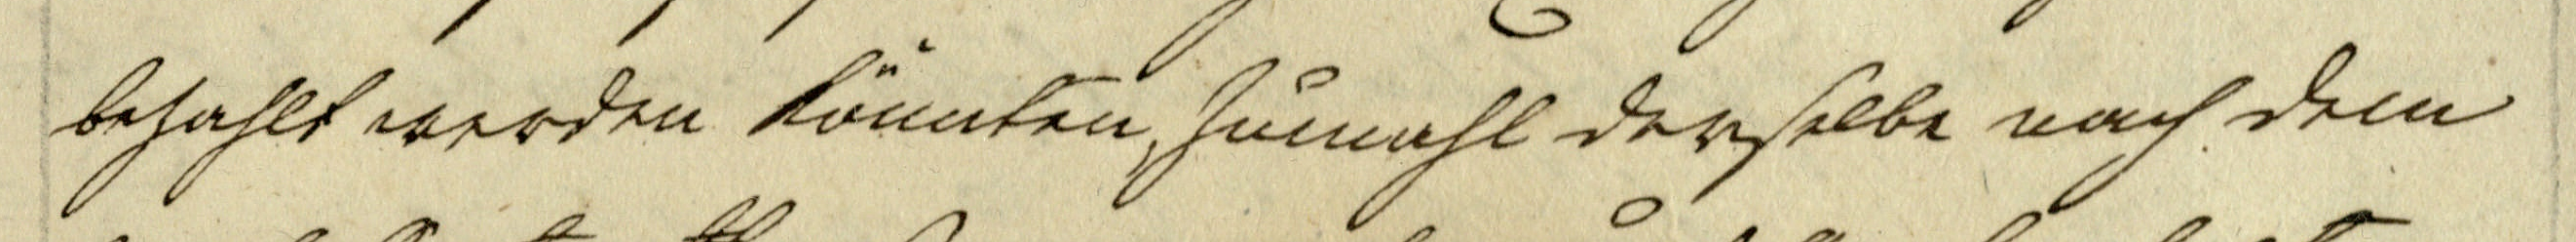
bezahlt werden könnten, zumahl derselbe nach dem
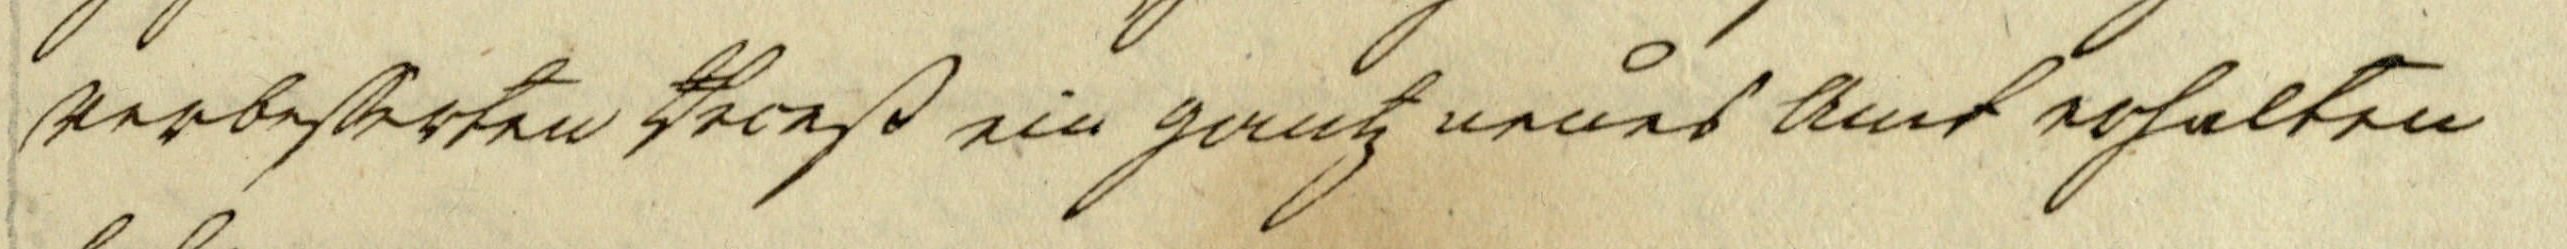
verbesserten Receß ein gantz neues Amt erhalten
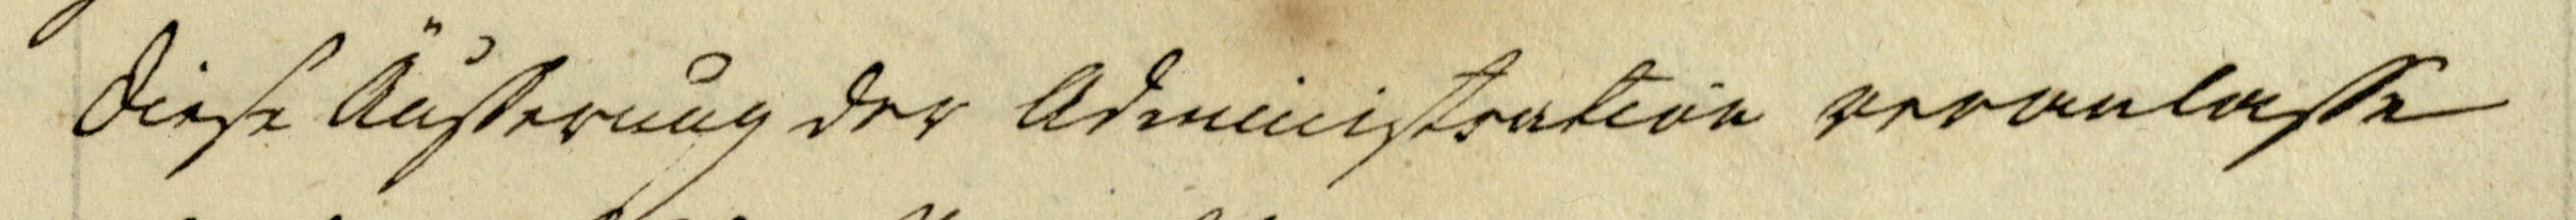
Diese Äusserung der Administration veranlasse
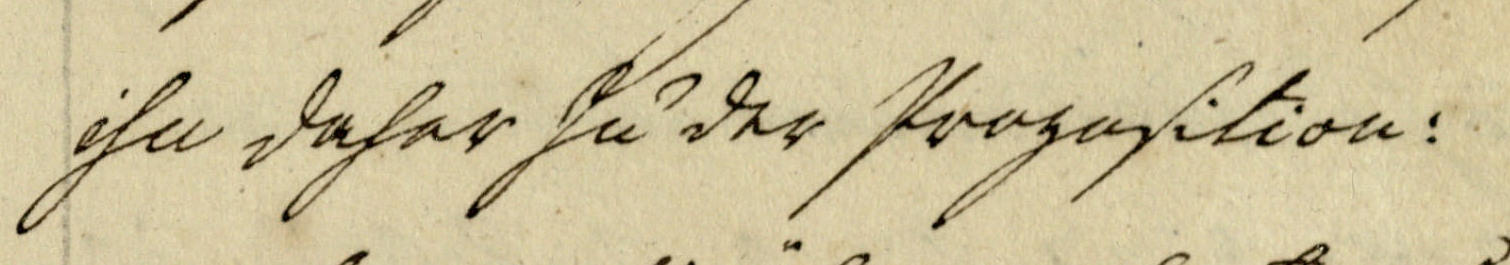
ihn daher zu der Proposition:
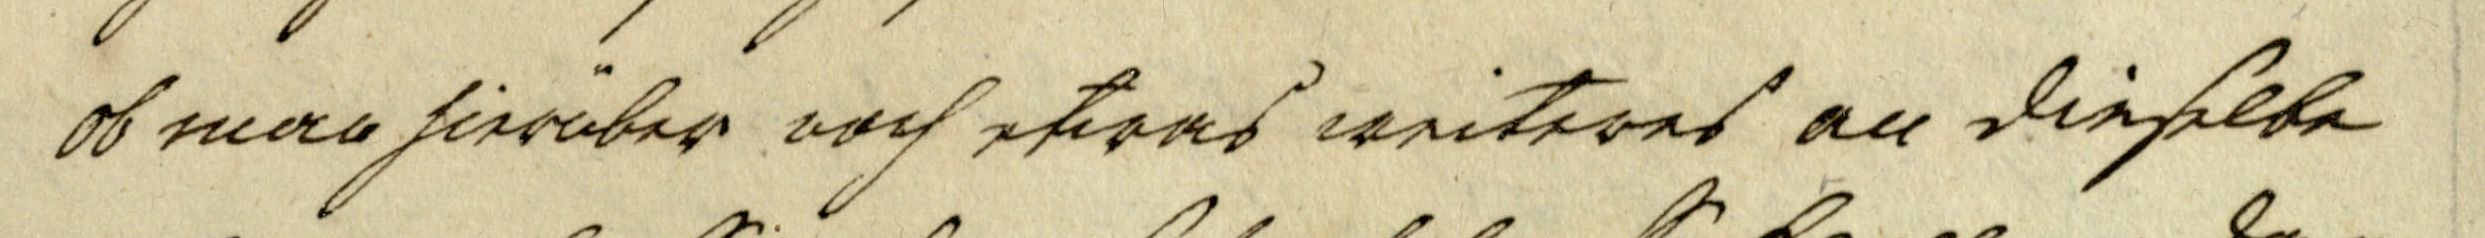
ob man hierüber noch etwas weiteres an dieselbe
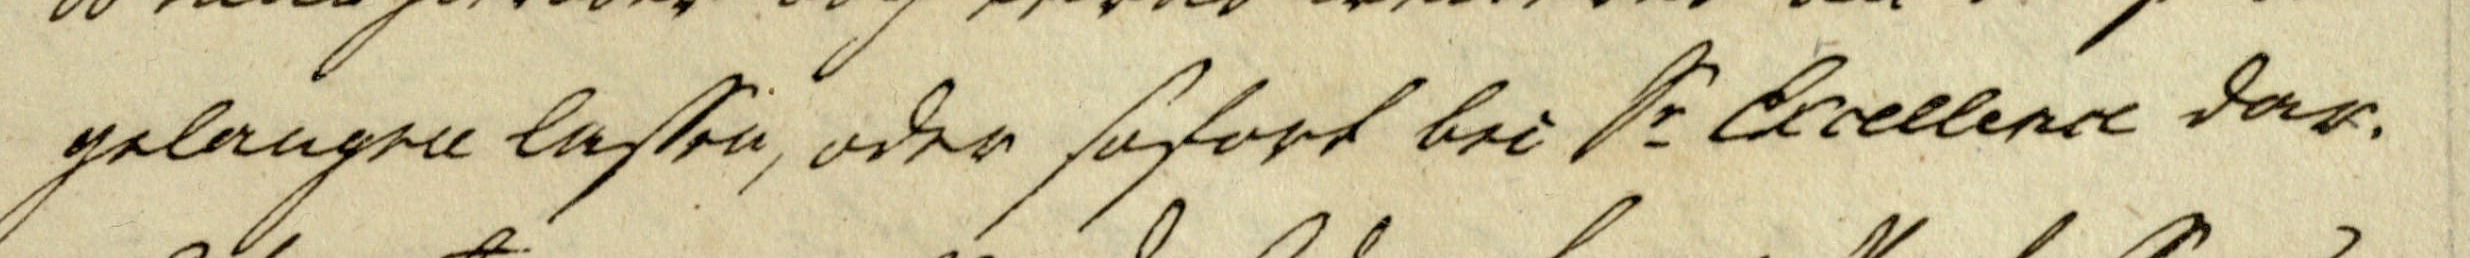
gelangen lassen, oder sofort bei Sr Excellence dar¬
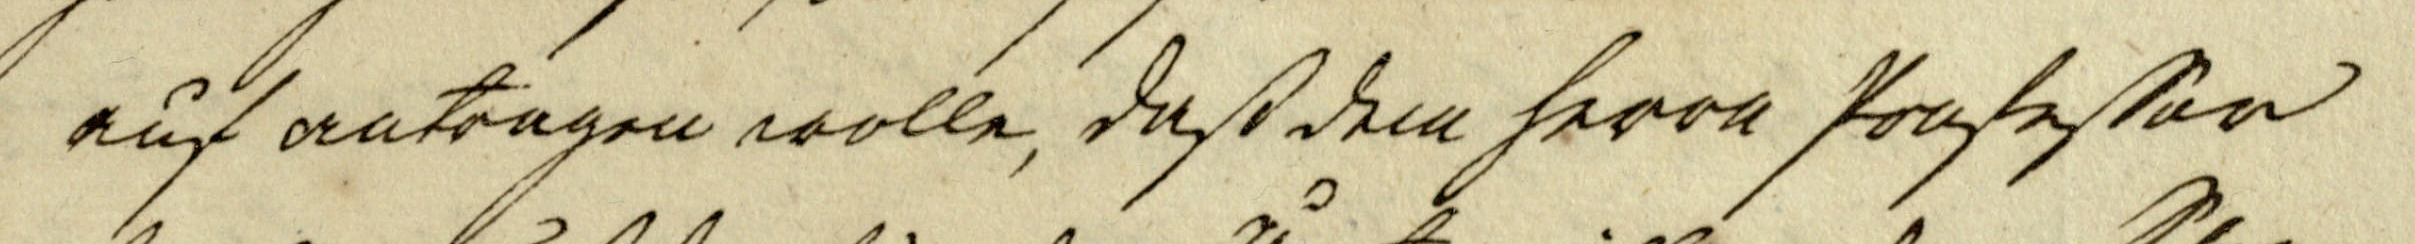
auf antragen wolle, daß dem Herrn Professor
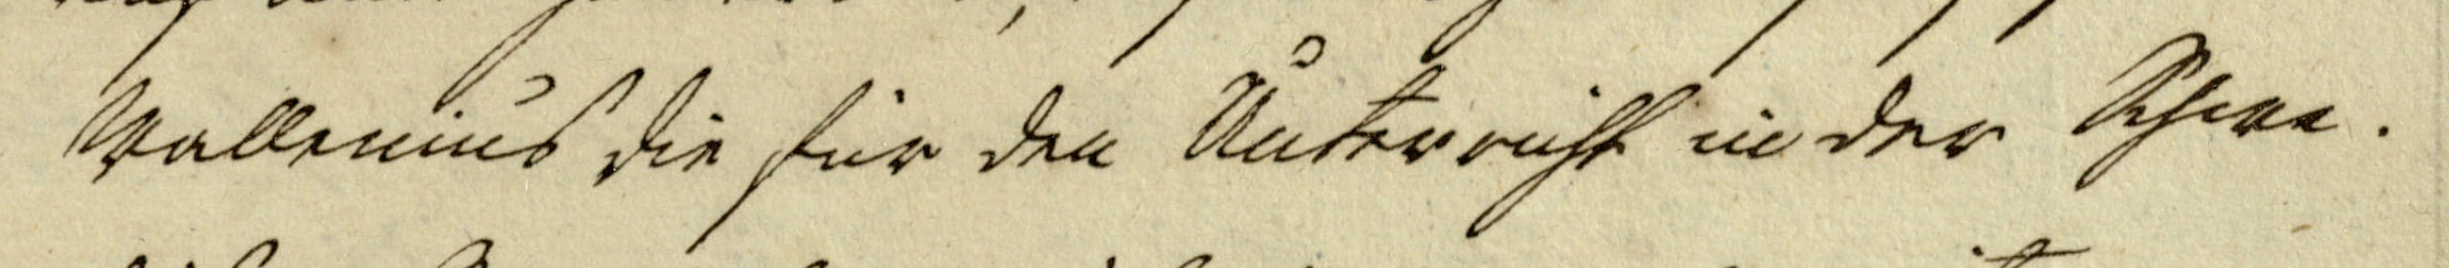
Wallenius die für den Unterricht in der Schwe¬
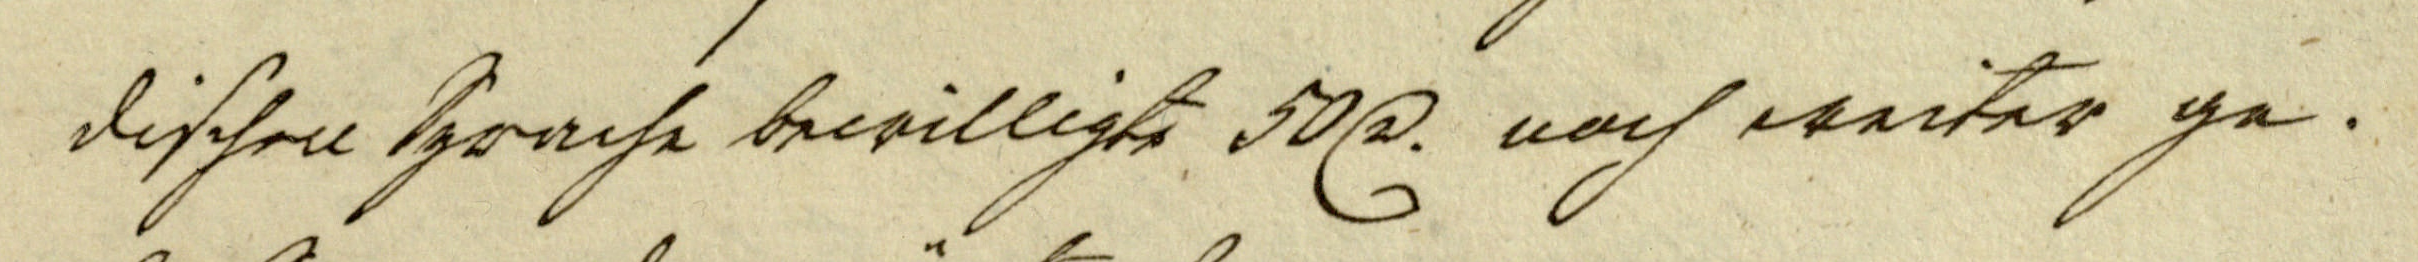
dischen Sprache bewilligte 50 l. noch weiter ge¬
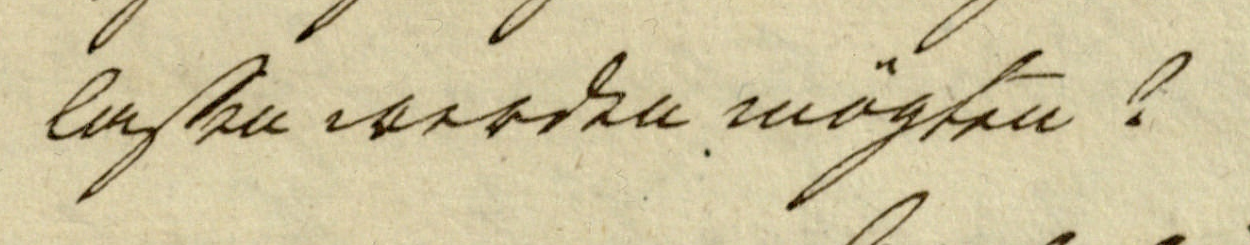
lassen werden mögten ?
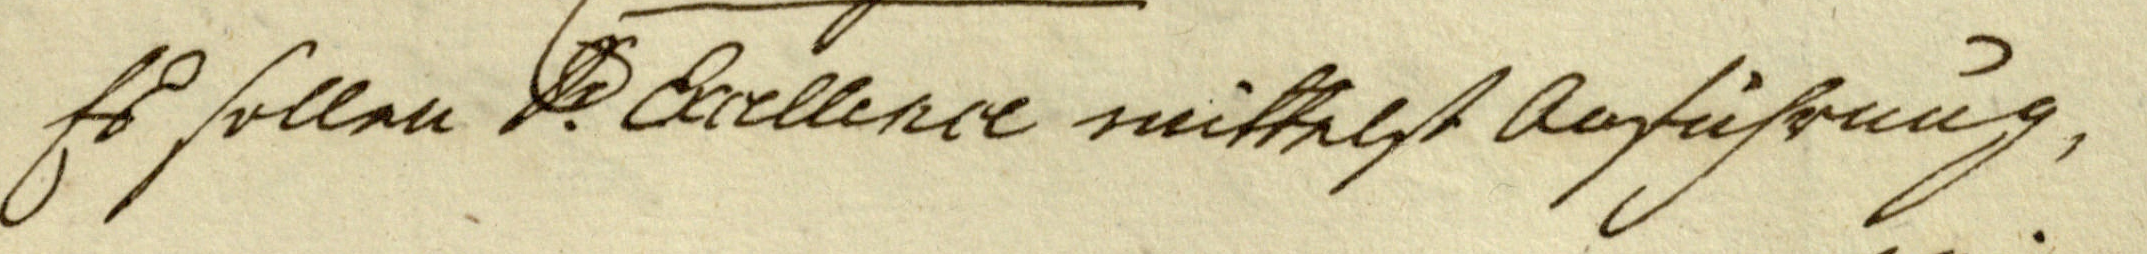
Es sollen Sr Excellence mittelst Anführung,
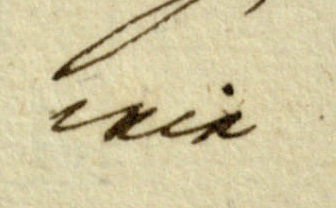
wie
